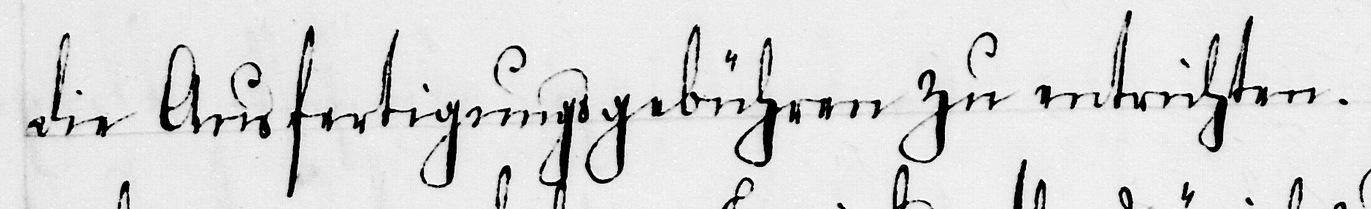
die Ausfertigungsgebühren zu entrichten.
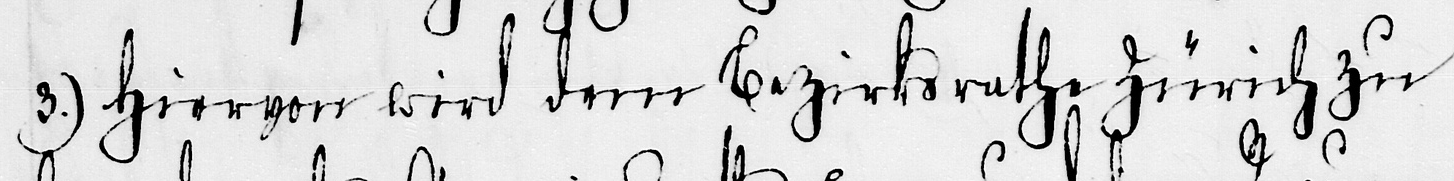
3.) Hiervon wird dem Bezirksrathe Zürich zu
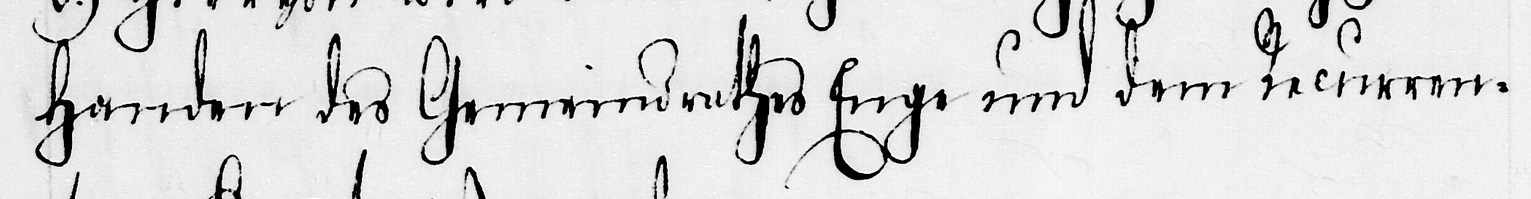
Handen des Gemeindrathes Enge und dem Recurren¬
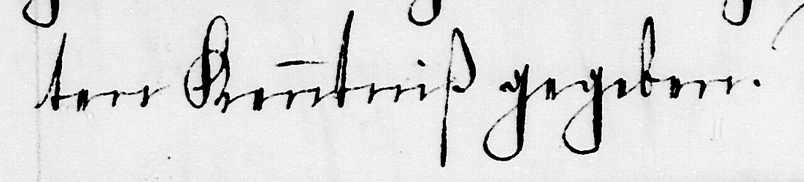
ten Kenntniß gegeben.
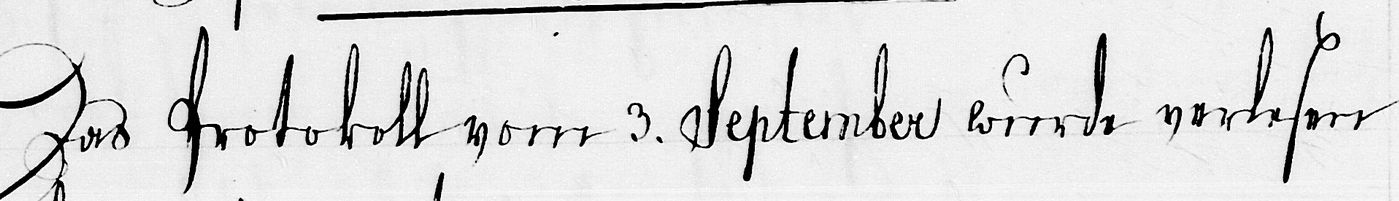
Das Protokoll vom 3. September wurde verlesen
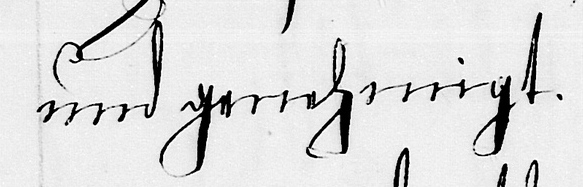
und genehmigt.
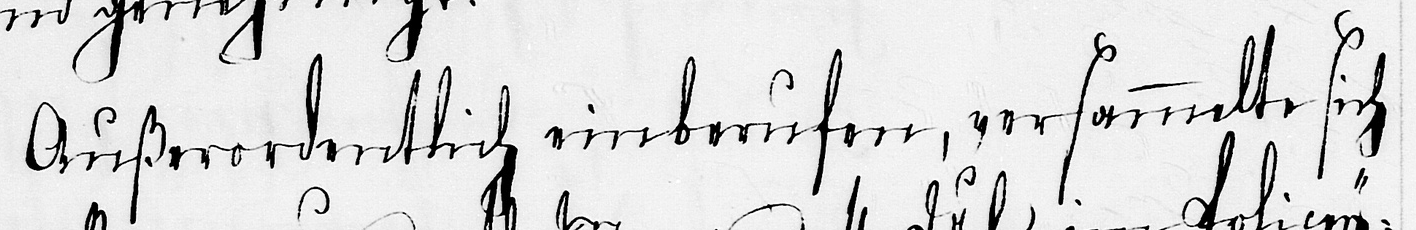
Außerordentlich einberufen, versammelte sich
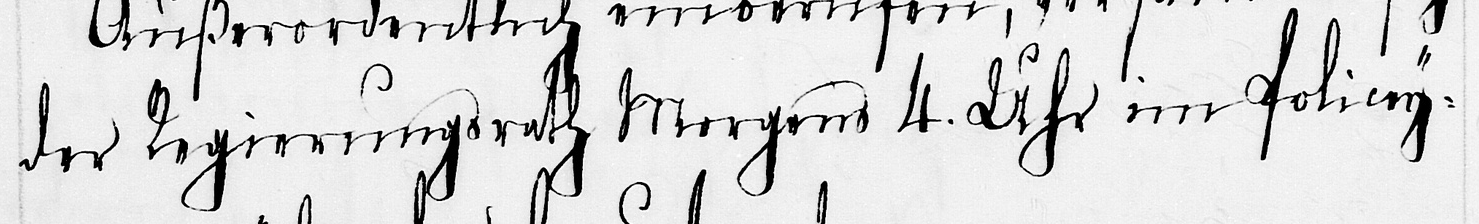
der Regierungsrath Morgens 4. Uhr im Policey¬
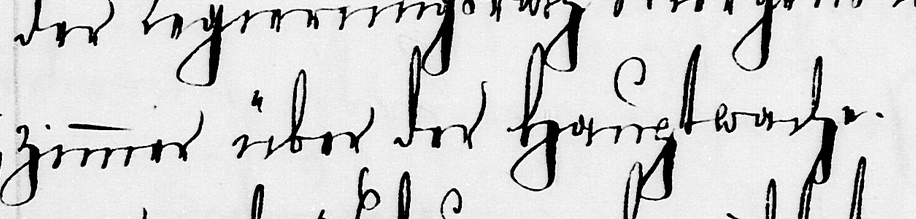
zimmer über der Hauptwache.
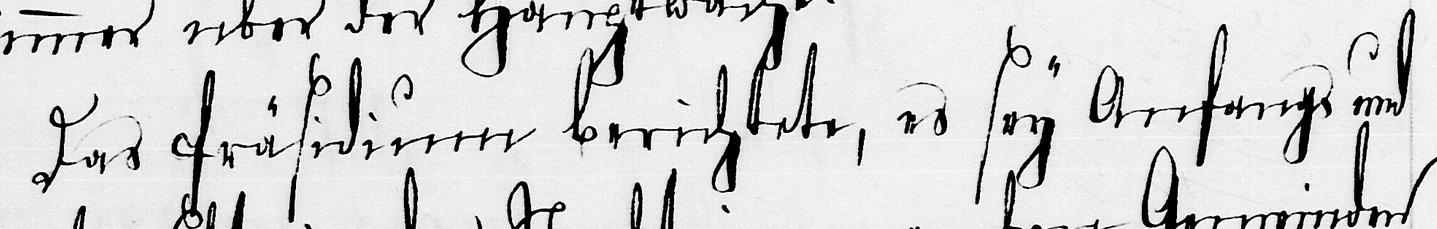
Das Präsidium berichtete, es sey Anfangs und
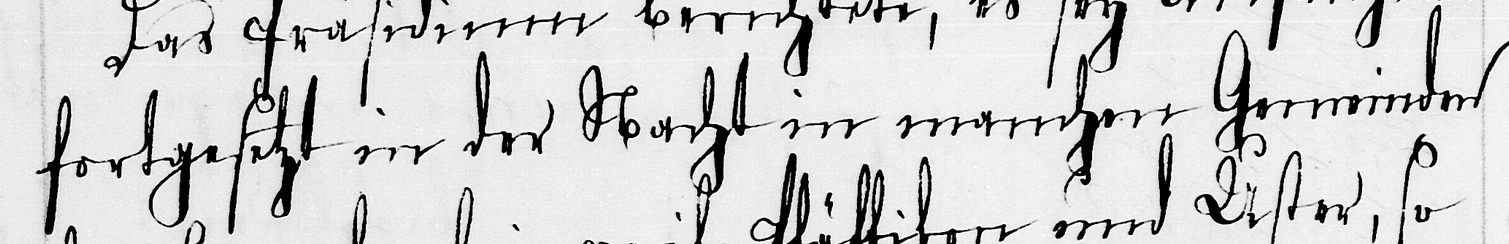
fortgesetzt in der Nacht in manchen Gemeinden
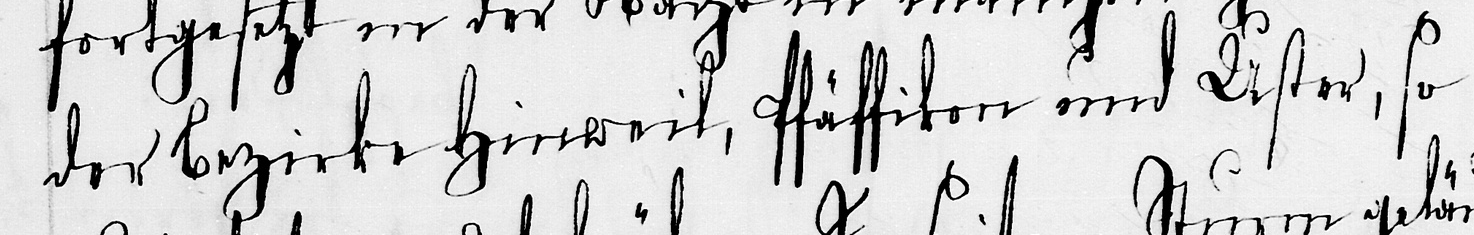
der Bezirke Hinweil, Pfäffikon und Uster, so
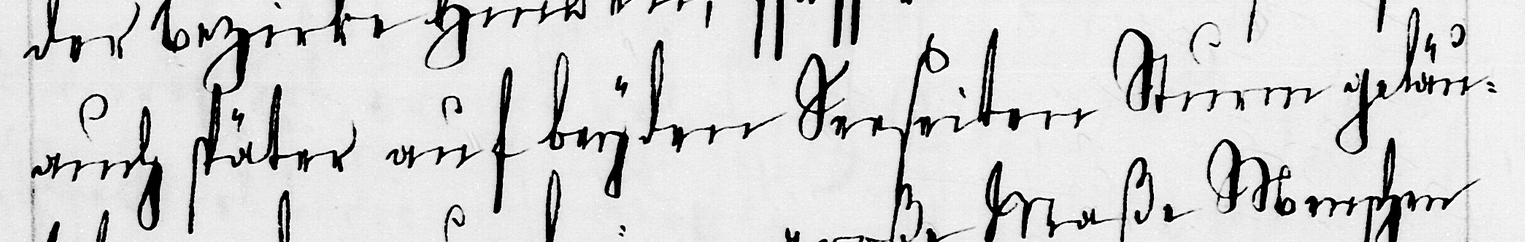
auch später auf beyden Seeseiten Sturm geläu¬
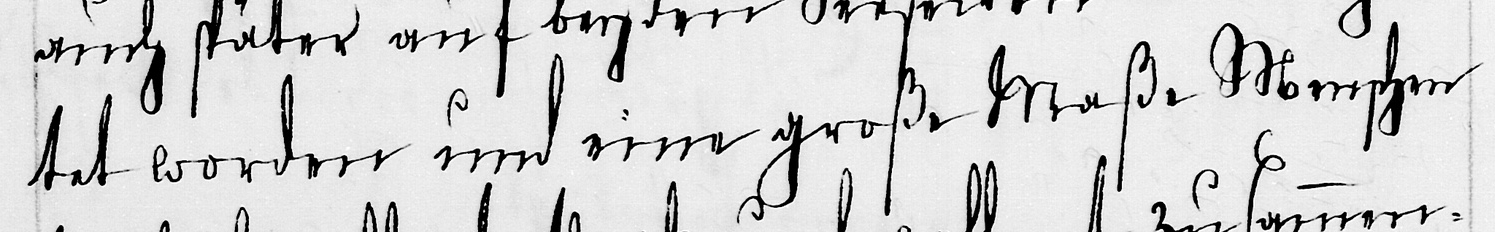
tet worden und eine große Maße Menschen
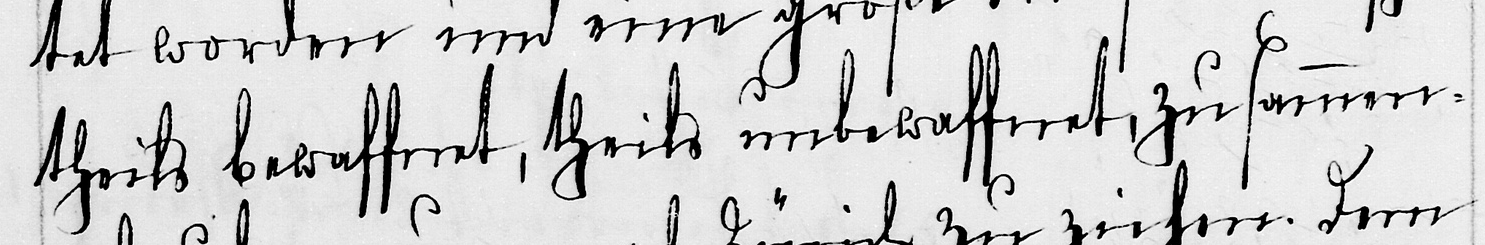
theils bewaffnet, theils unbewaffnet, zusammen¬
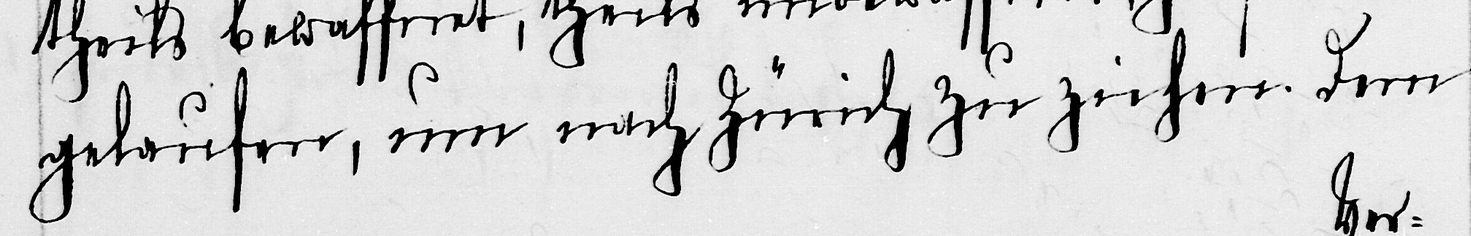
gelaufen, um nach Zürich zu ziehen. Dem
